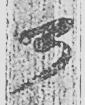乃
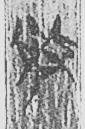敓
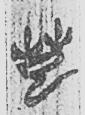芸
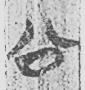公
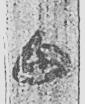囟
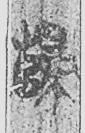{𡴎帚}
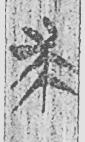求
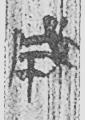成
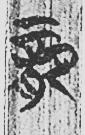龍
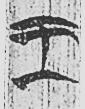王
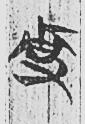史
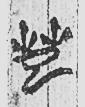芸
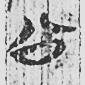公
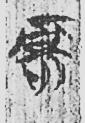{口甹}
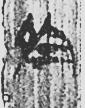於
